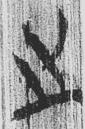之
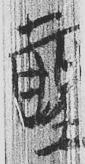聖（聲）
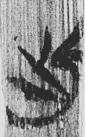此
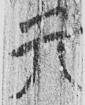亓（其）
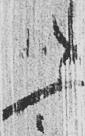一
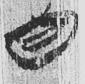回
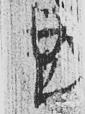也
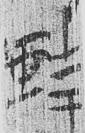○（珪玉）
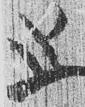之
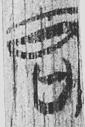君
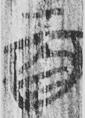百
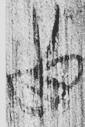貞？
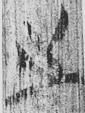之
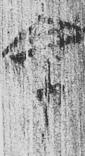宔（主）
